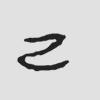己
